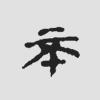不
